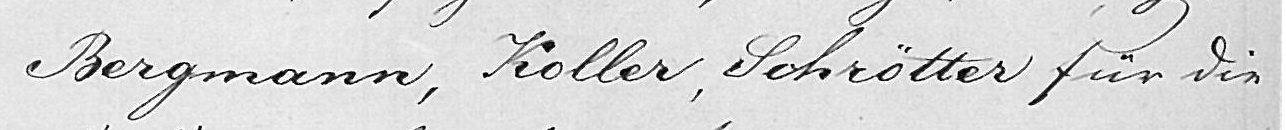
Bergmann, Koller, Schrötter für die
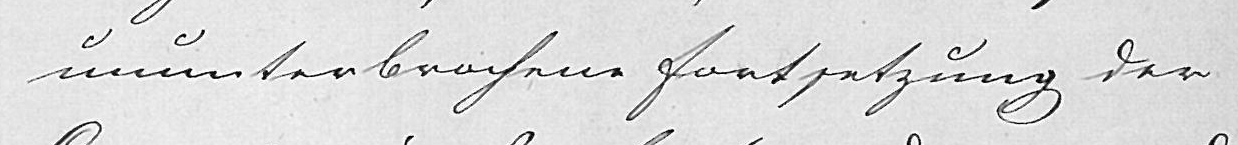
unterbrochene Fortsetzung der
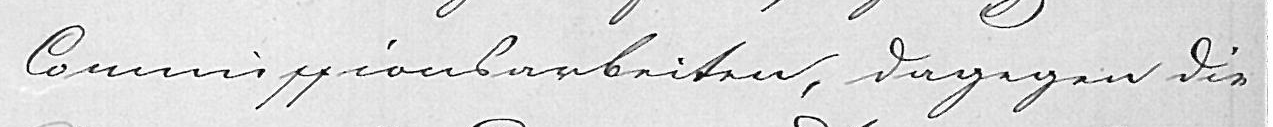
Commissionsarbeiten, dagegen die
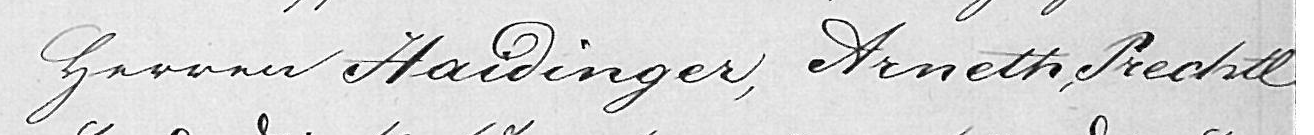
Herren Haidinger, Arneth, Prechtl
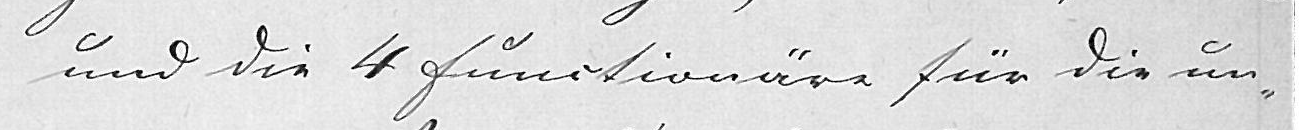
und die 4 Functionäre für die un-
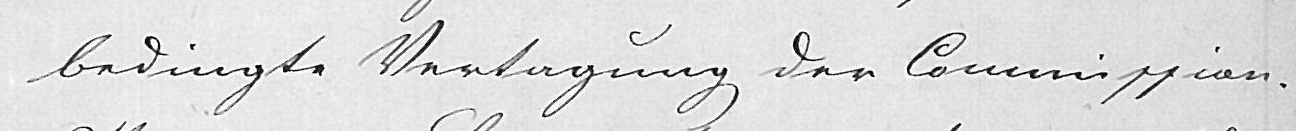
bedingte Vertagung der Commission.
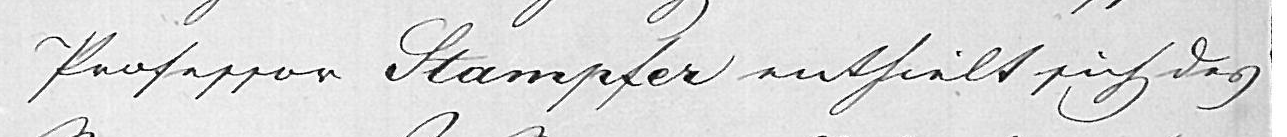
Professor Stampfer enthielt sich des
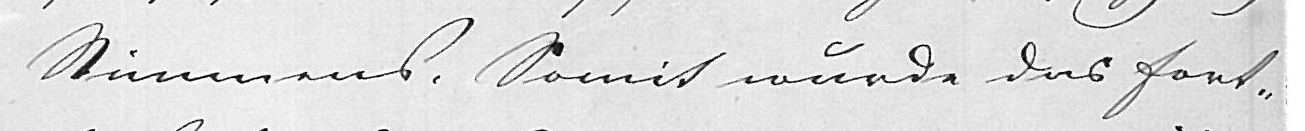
Stimmens. Somit wurde das Fort-
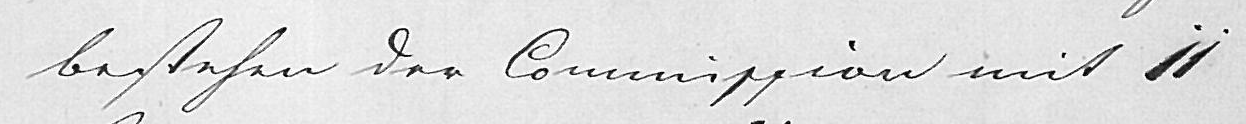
bestehen der Commission mit 11
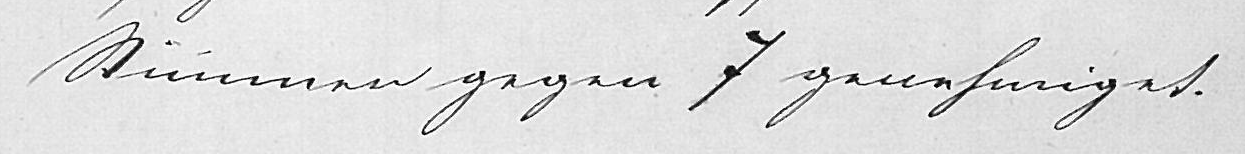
Stimmen gegen 7 genehmiget.
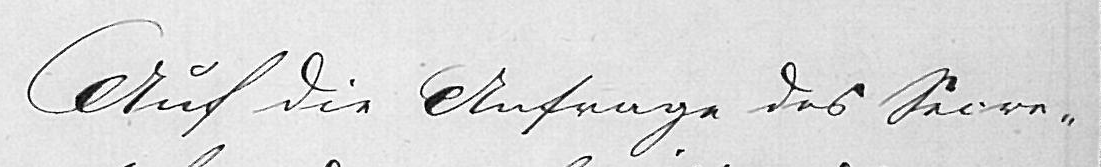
Auf die Anfrage des Secre-
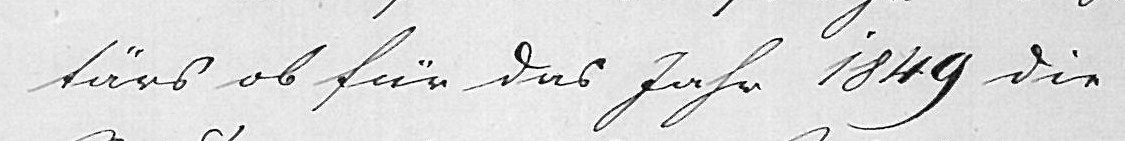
tärs ob für das Jahr 1849 die
